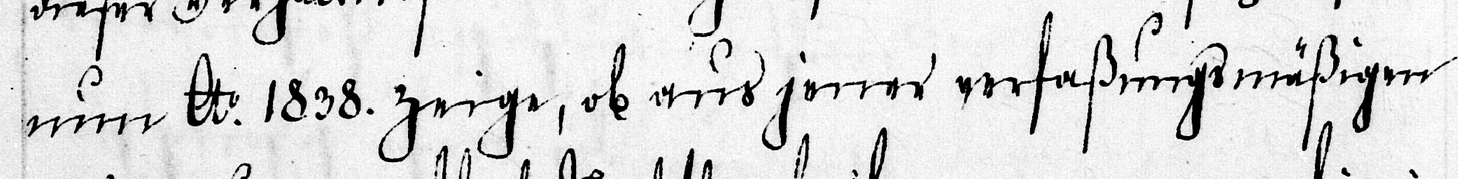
nun Ao. 1838. zeige, ob aus jener verfaßungsmäßigen
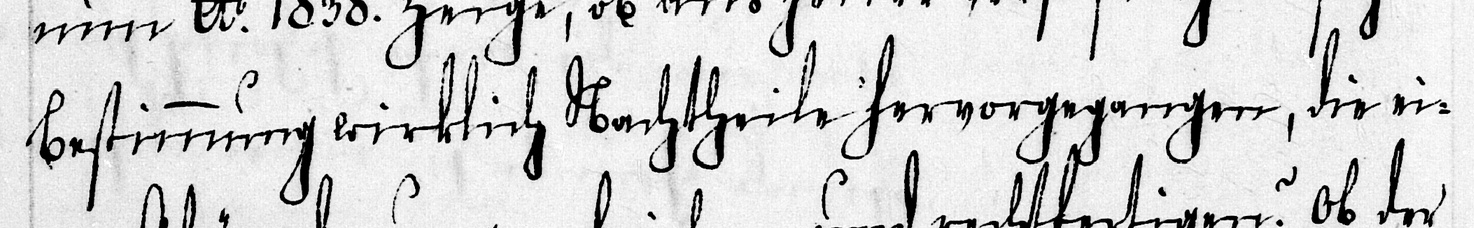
Bestimmung wirklich Nachtheile hervorgegangen, die ein¬
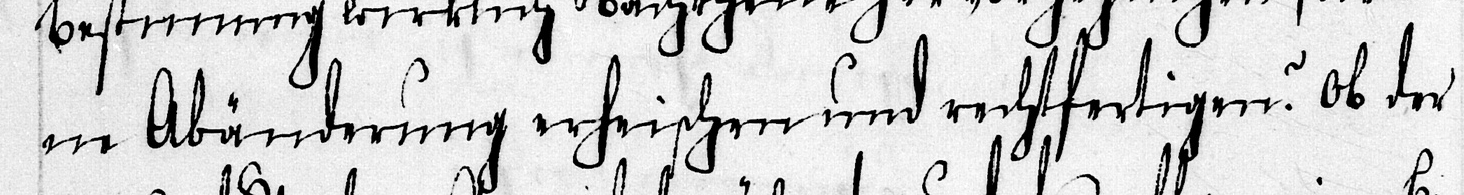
e Abänderung erheischen und rechtfertigen? Ob der
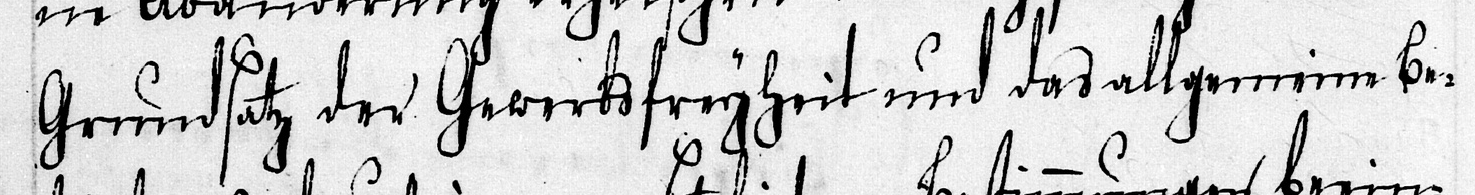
Grundsatz der Gewerbsfreyheit und das allgemeine Be¬
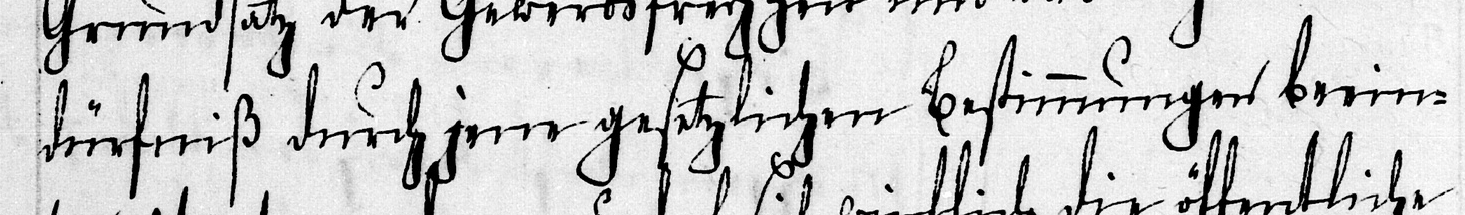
dürfniß durch jene gesetzlichen Bestimmungen beein¬
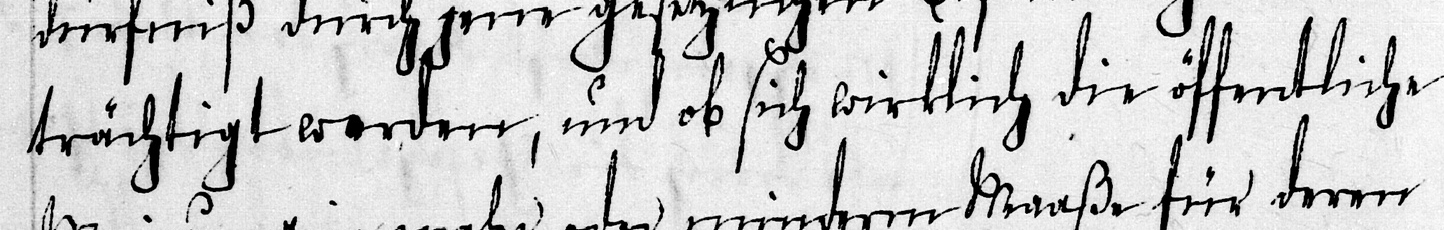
trächtigt werden, und ob sich wirklich die öffentliche
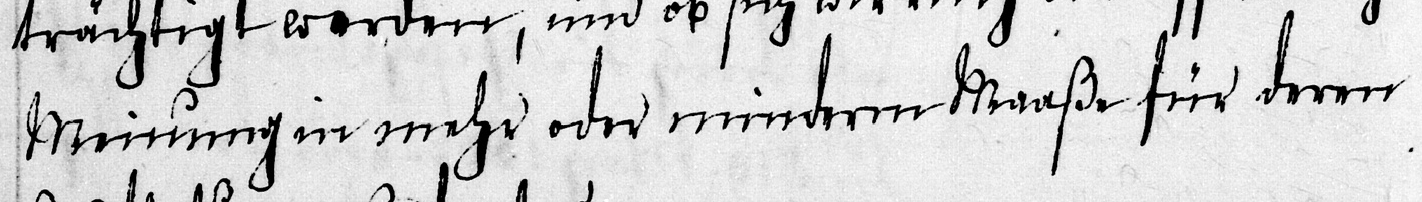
Meinung in mehr oder minderm Maaße für deren
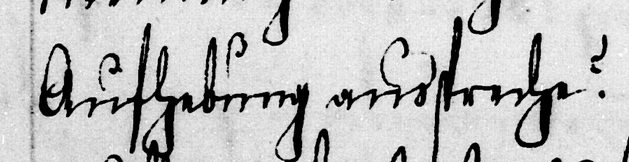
Aufhebung ausspreche?
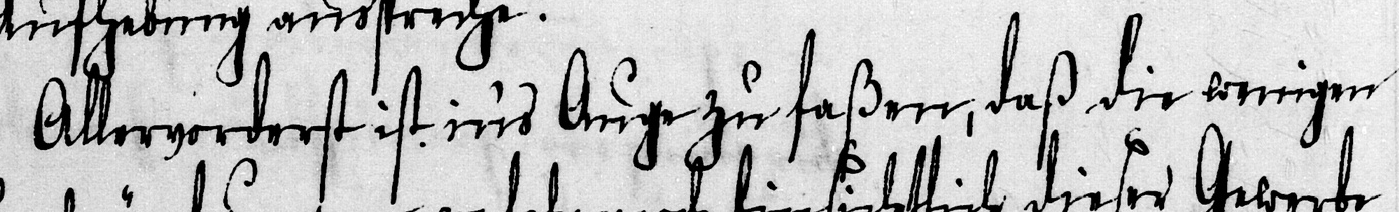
Allervorderst ist in’s Auge zu faßen, daß die wenigen
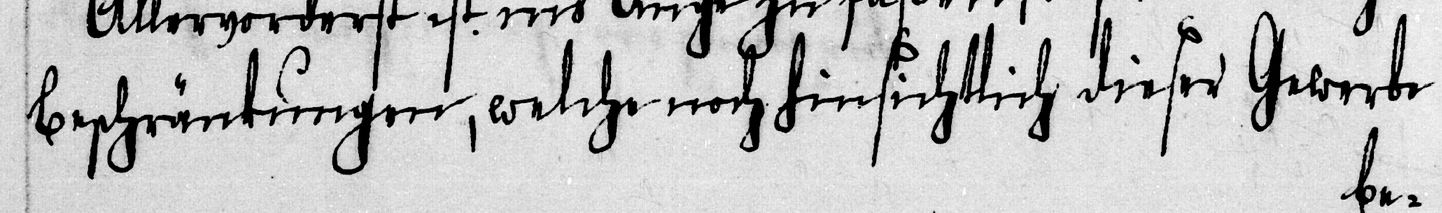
Beschränkungen, welche noch hinsichtlich dieser Gewerbe
